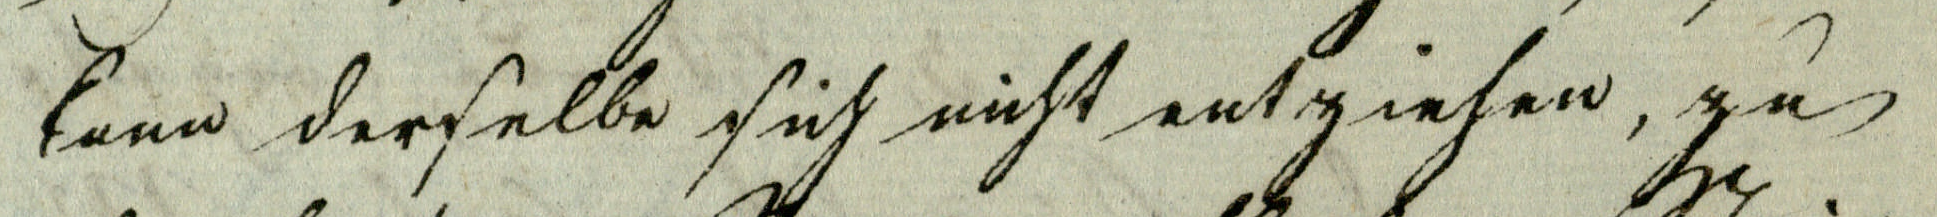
kann derselbe sich nicht entziehen, zu
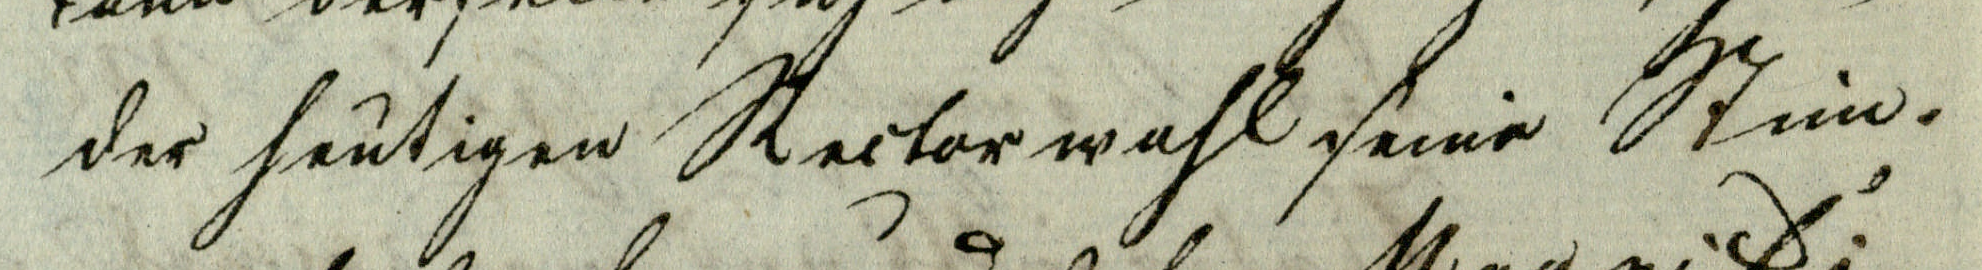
der heutigen Rectorwahl seine Stim¬
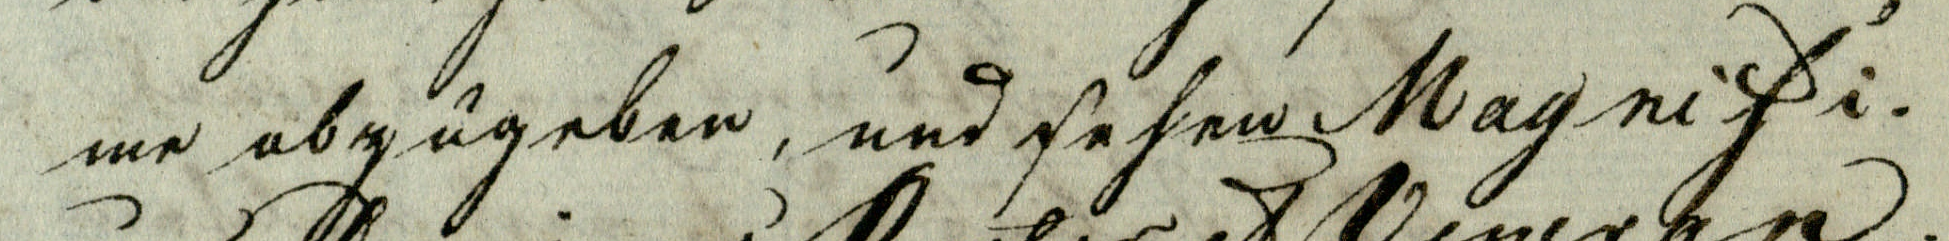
me abgzugeben, und sehen Magnifi¬
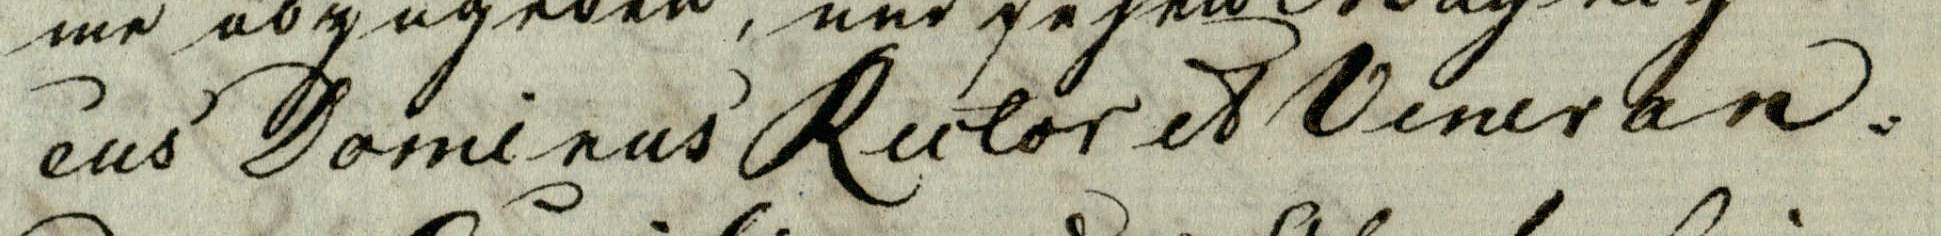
cus Dominus Rector et Veneran¬
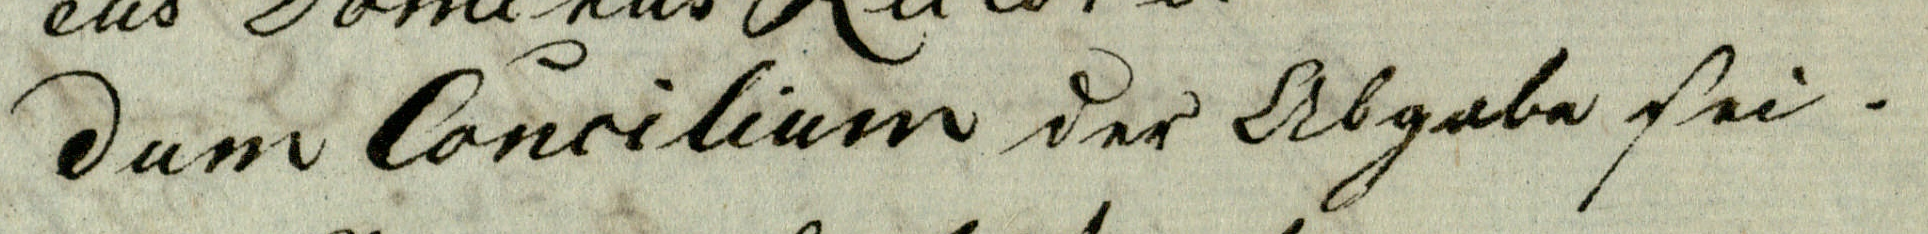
dum Concilium der Abgabe sei¬
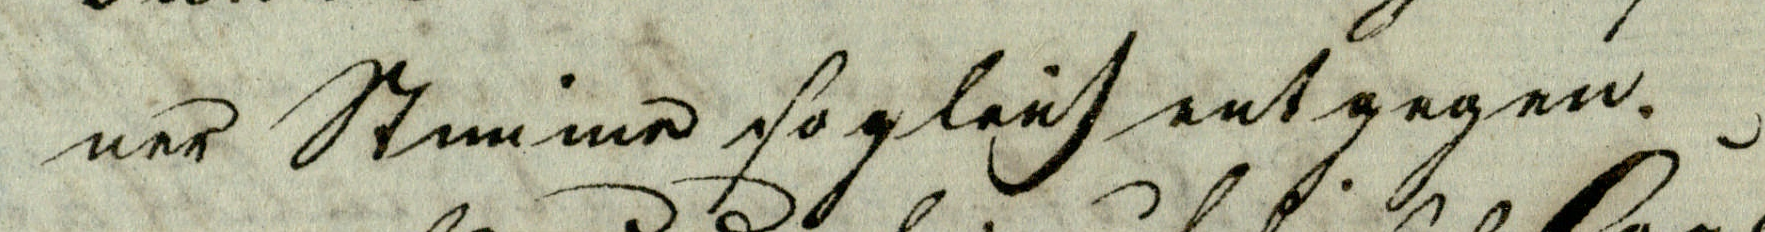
ner Stimme sogleich entgegen.
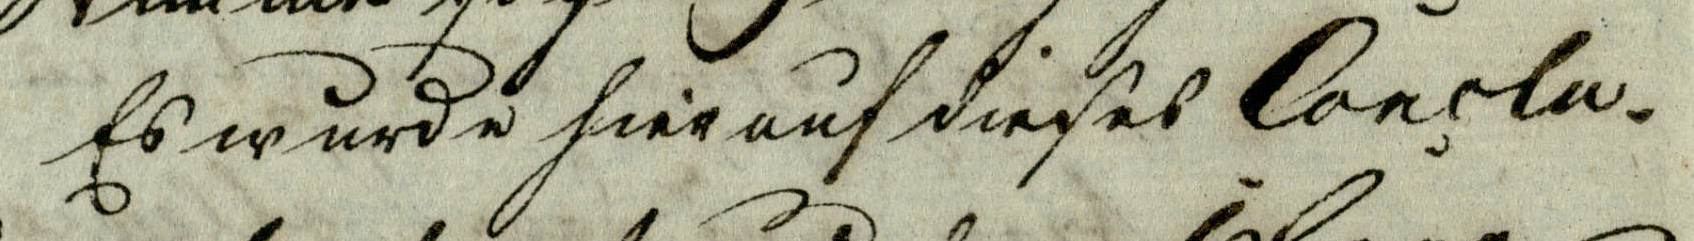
Es wurde hierauf dieses Conclu¬
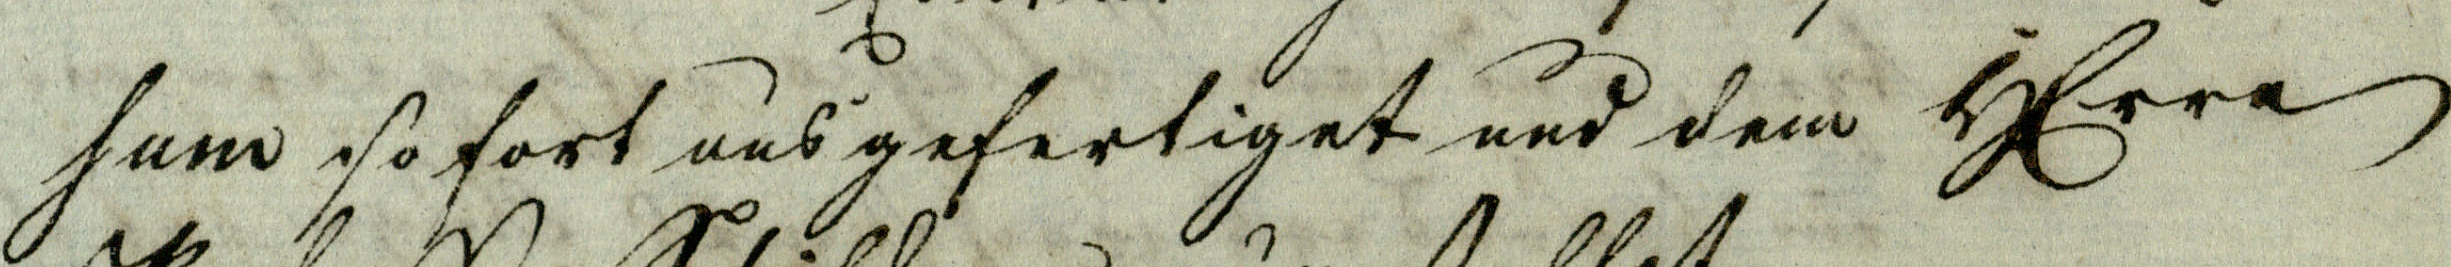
sum sofort ausgefertiget und dem Herrn
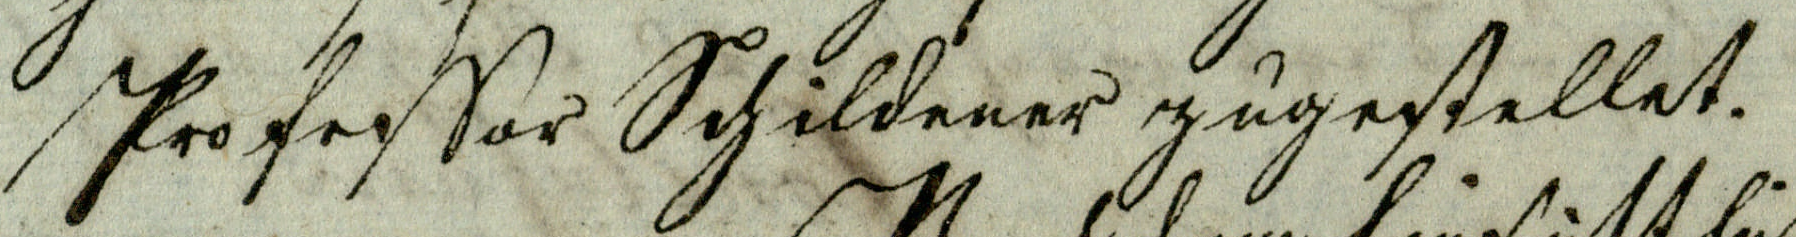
Professor Schildener zugestellet.
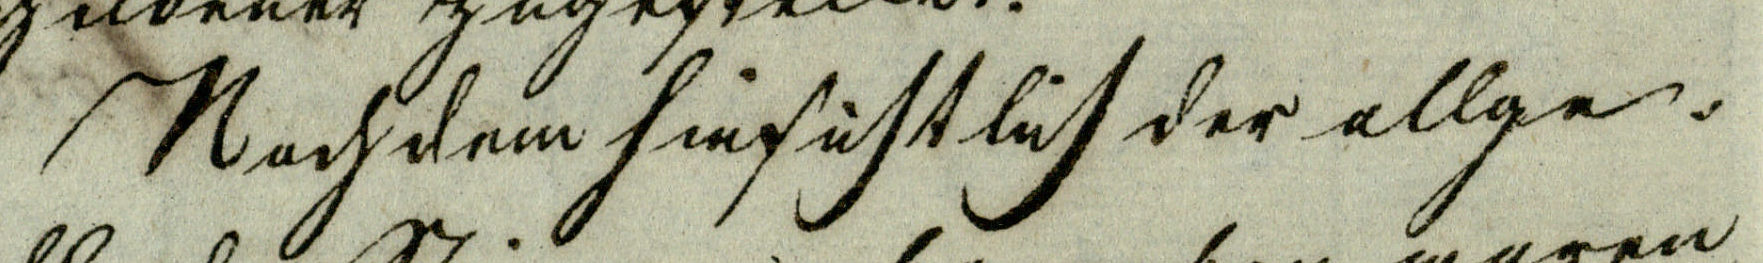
Nachdem hinsichtlich der allge¬
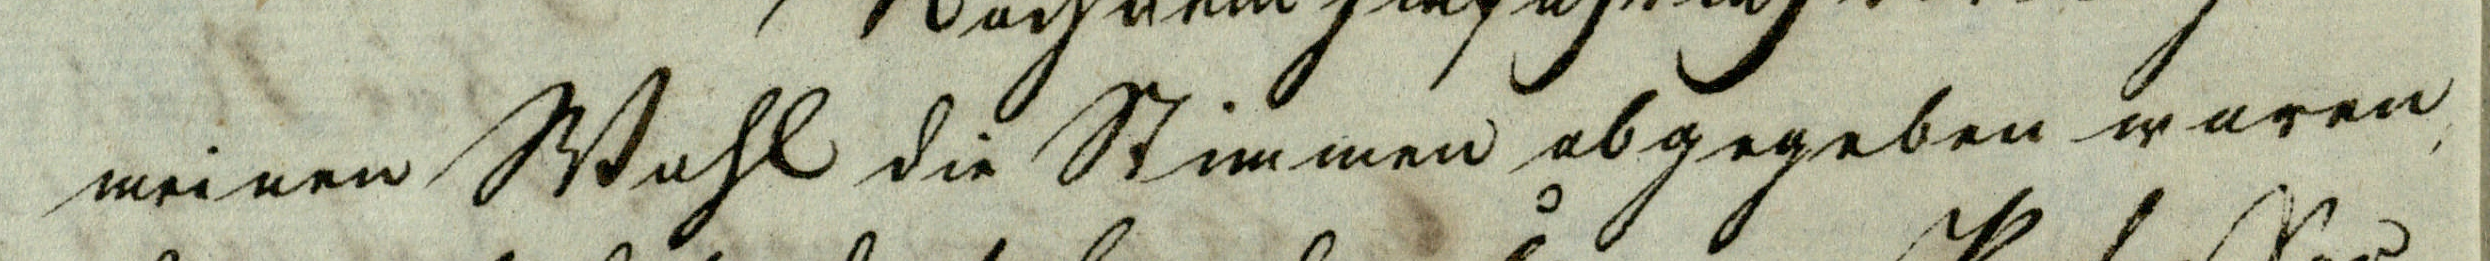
meinen Wahl die Stimmen abgegeben waren,
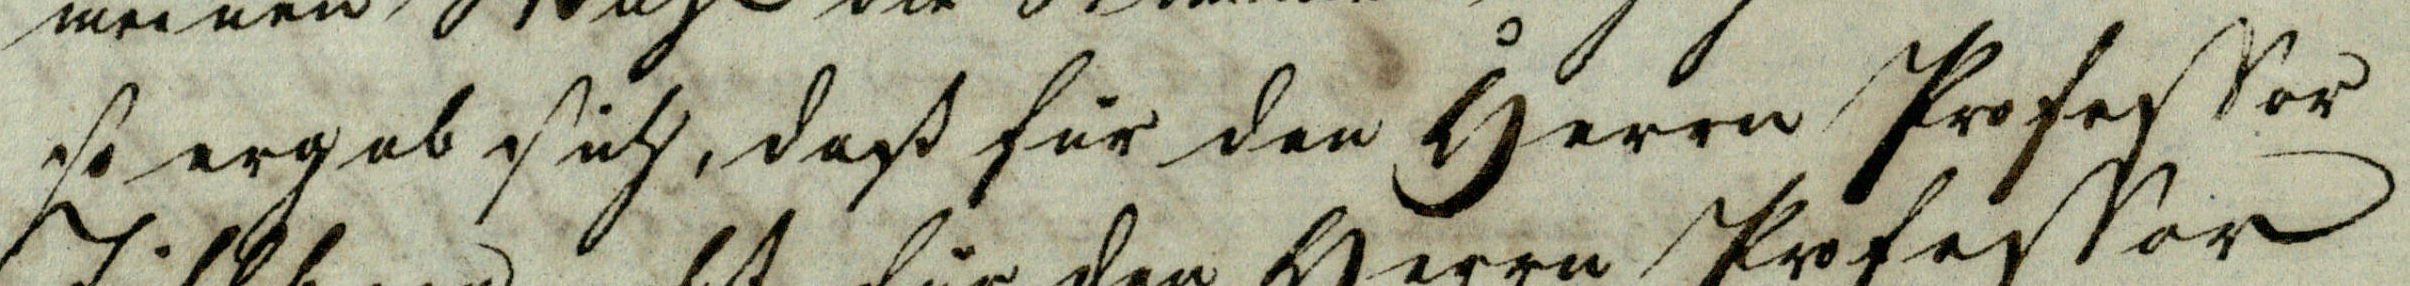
so ergab sich, daß für den Herrn Professor
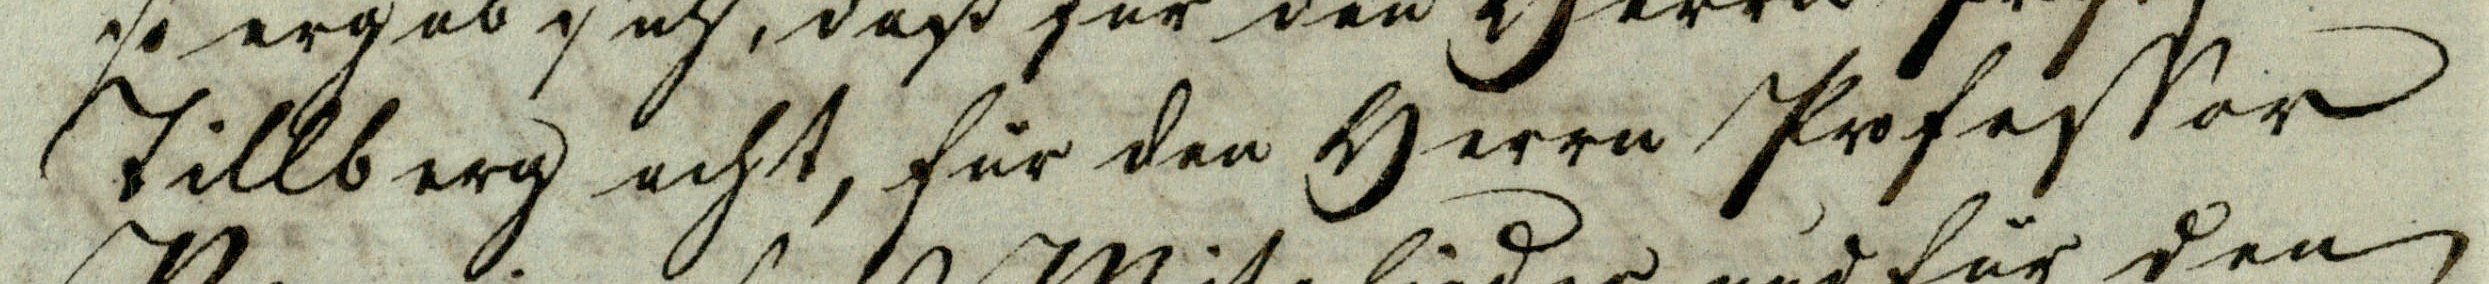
Tillberg, acht, für den Herrn Professor
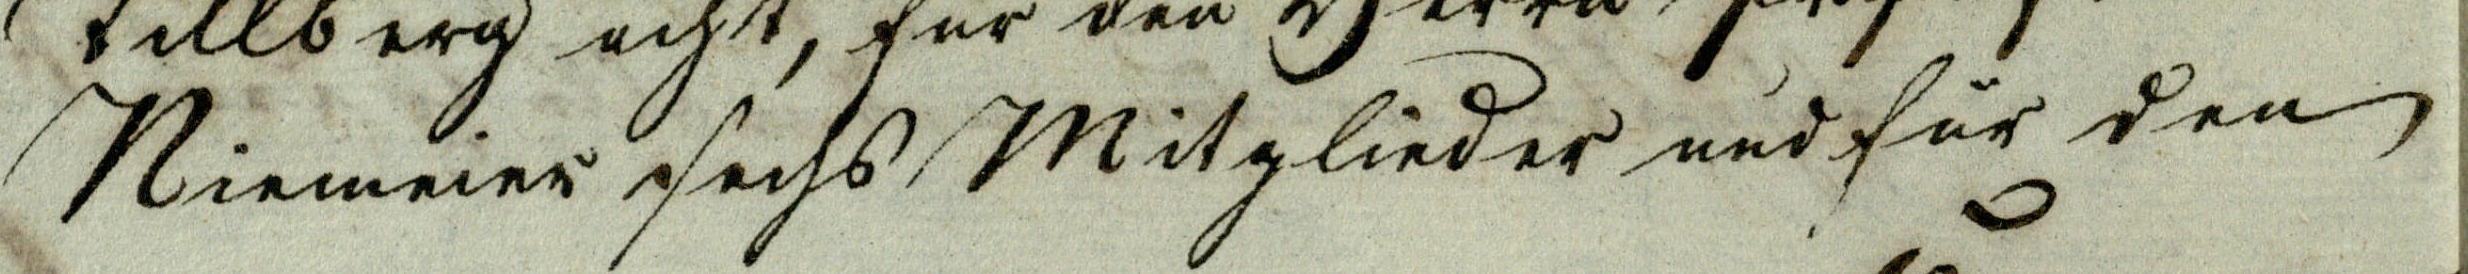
Niemeier sechs Mitglieder und für den
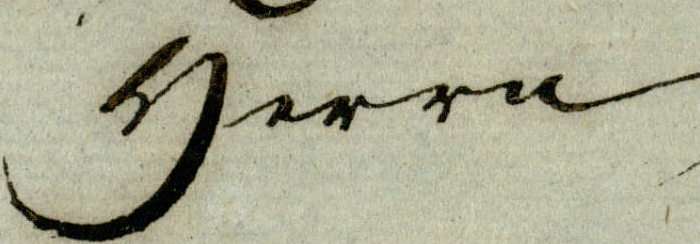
Herrn
